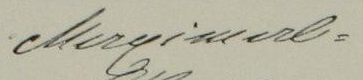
Maximal-
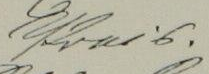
Preis
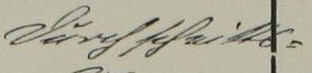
Durchschnitts-
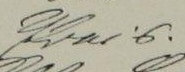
Preis
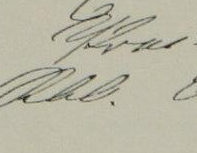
Rbl.
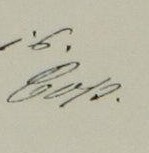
Cop.
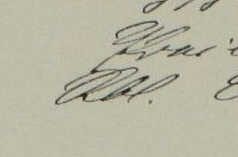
Rbl.
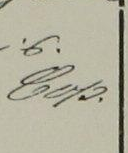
Cop.
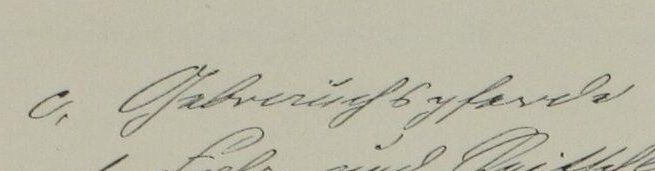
c. Gebrauchspferde
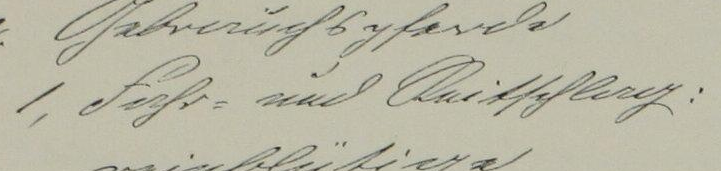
1. Fahr- und Reitschlag:
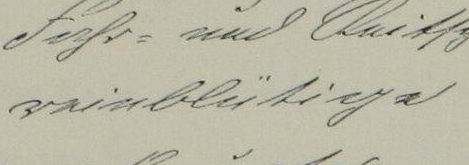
reinblütige
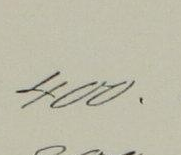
400
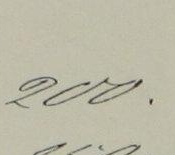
200
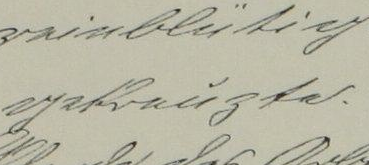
gekreuzte
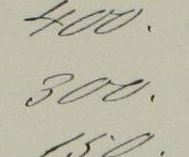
300
